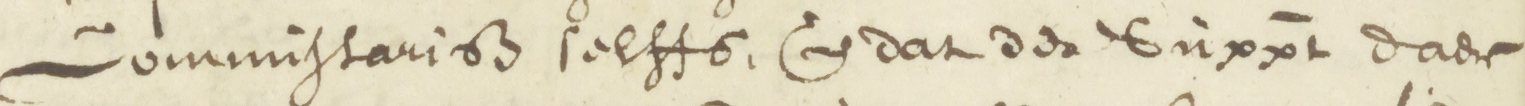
Commissaris. selffs. & dat den suppt. daer
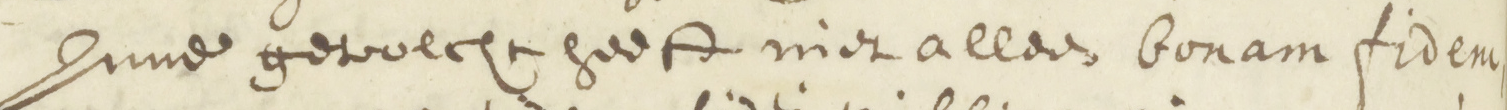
Inne gevolcht heeft niet alleen bonam fidem
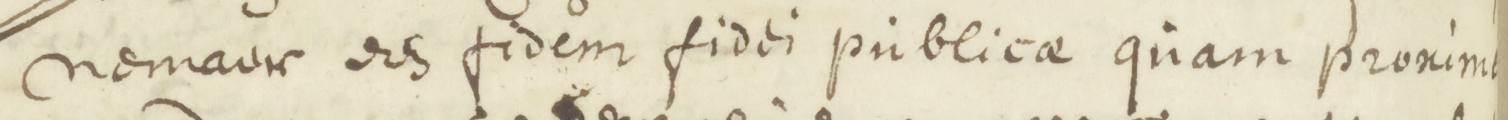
nemaer den fidem fidei publicæ quam proxime
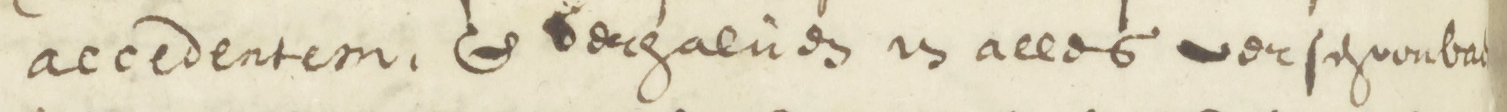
accedentem. & derhalven in alles verschoonbaer
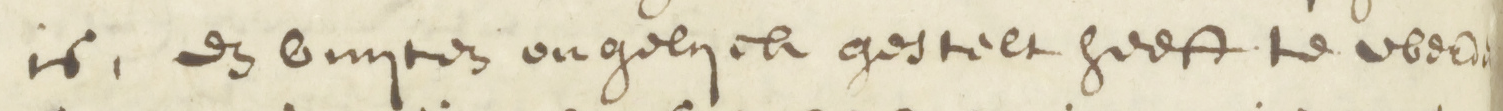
is en buyten ongelijck gestelt heeft te werden
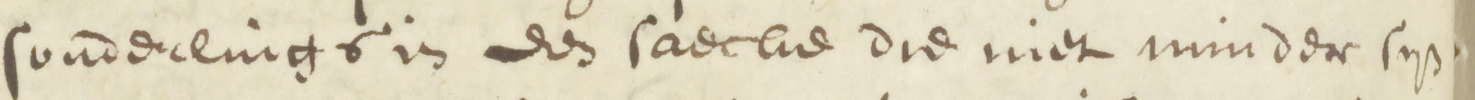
sonderlings in een saecke die niet minder syn
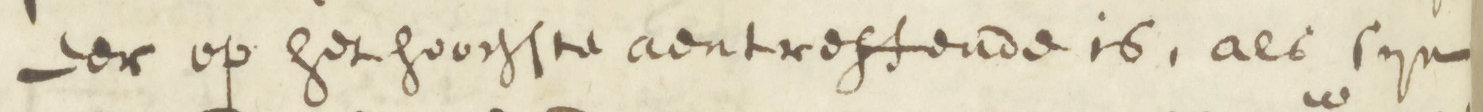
eer op het hoogste aentreffende is, als syn
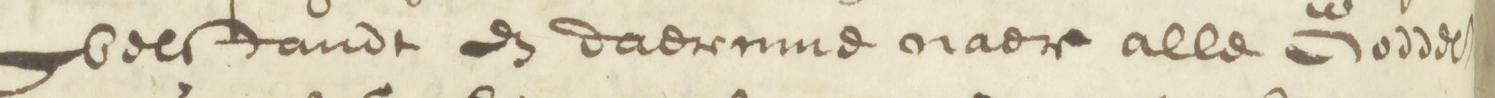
welstandt en daerinne naer alles Goddel
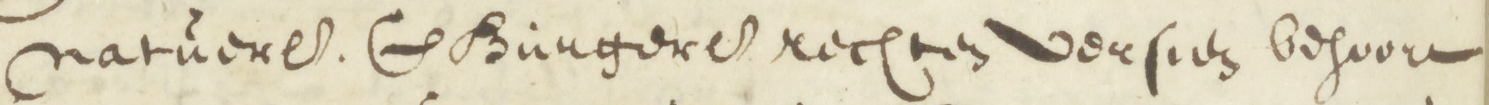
natuerl. & Burgerl rechten versien behoort
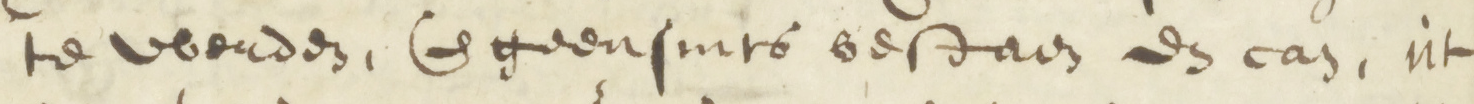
te werden & geensints bestaen en can, ut
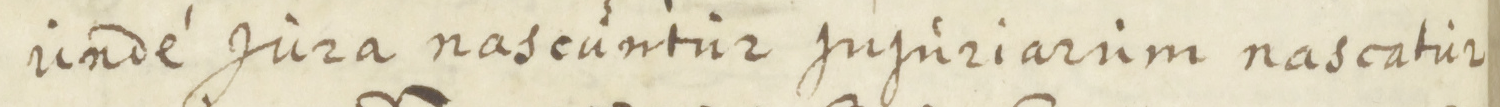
unde Jura nascuntur injuriarum nascatur
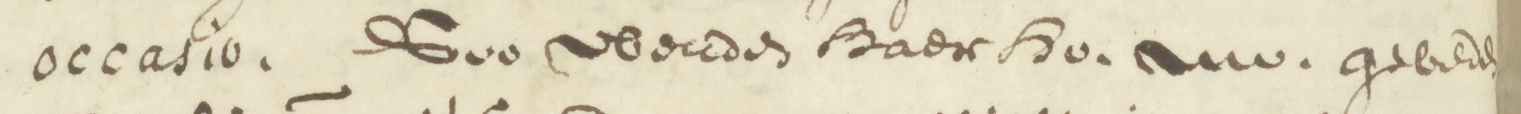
occasio. Soo werden Haer Ho:Mo: gebeden
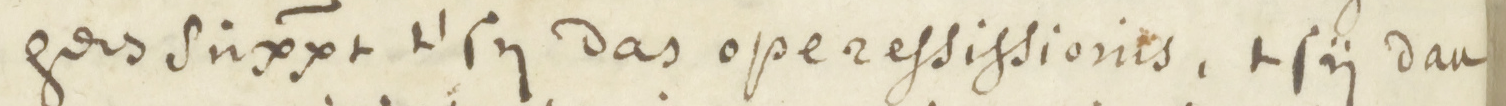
hem supplt t'sij dan operessissionis t sij dan
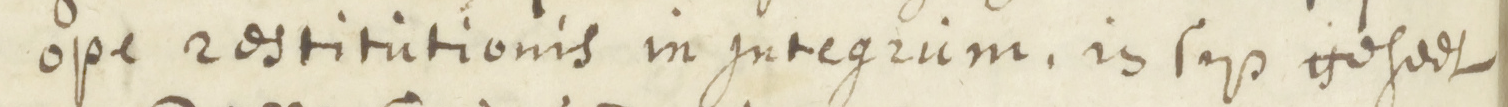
ope restitutionis in integrum is sijn geheel
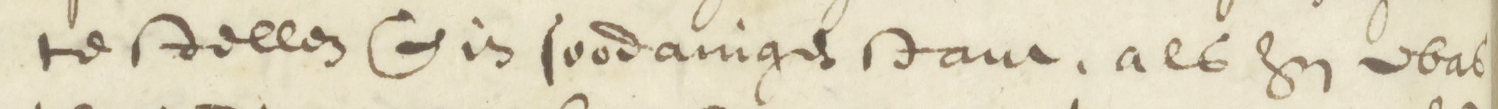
te stellen & in soodanigen stant, als hij was
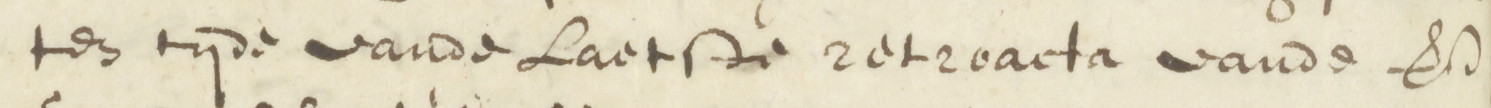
ten tijde vande laetste retroacta van de vs
